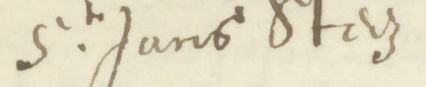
St. Jans Steen
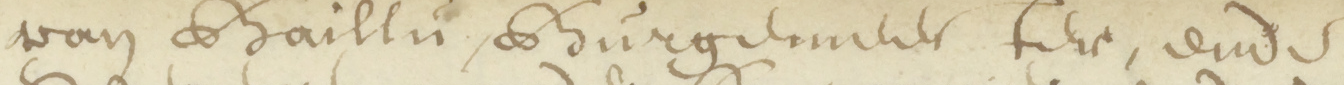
van Baillu, Burgemeester, ende
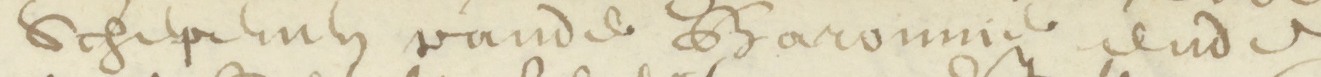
Schepenen vande Baronnie, ende
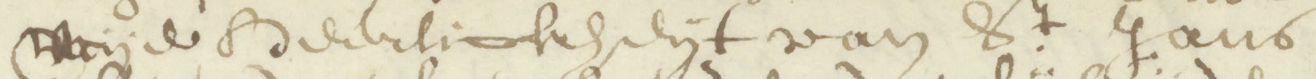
vrije heerlickheijt van St. Jans
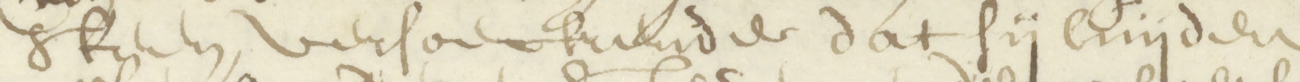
Steen, versoeckende dat sij luijden
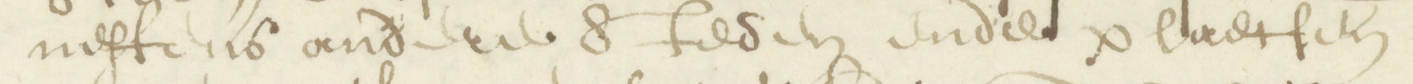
neffens andere Steden ende plaetsen
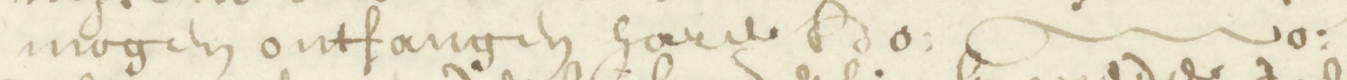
mogen ontfangen hare Ho:Mo:
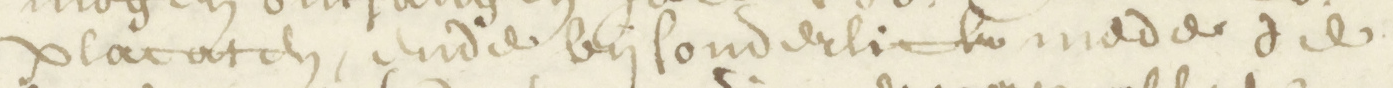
placaten, ende bijsonderlick mede de
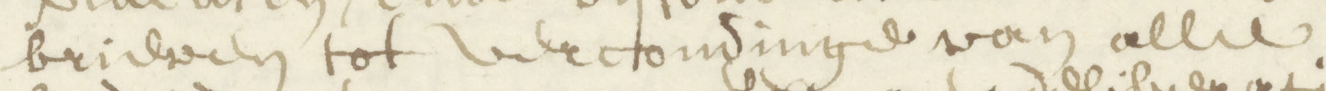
brieven tot vercondinge van alle
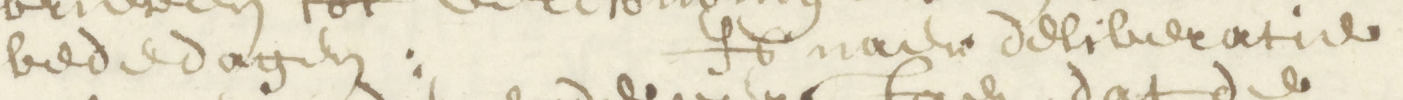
bededagen: Is naer deliberatie
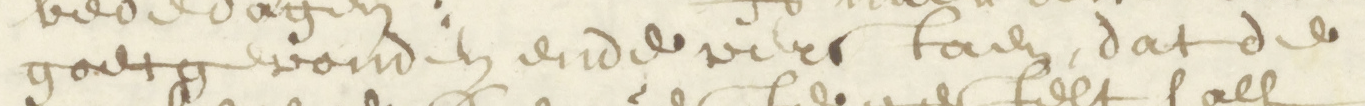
goetgevonden ende verstaen, dat de
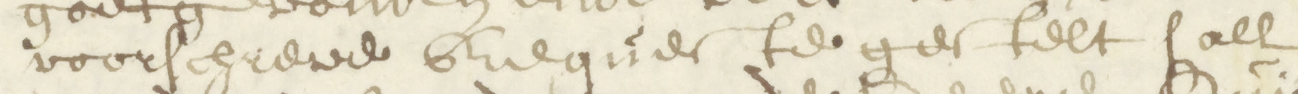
voorschreve requeste gestelt sall
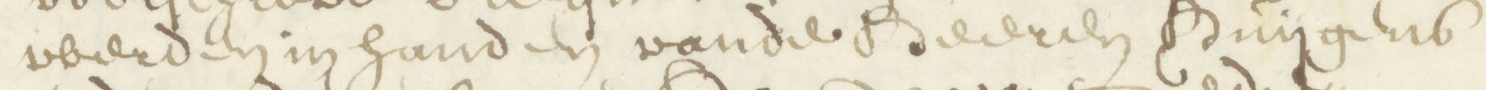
werden in handen vande Heeren Huijgens
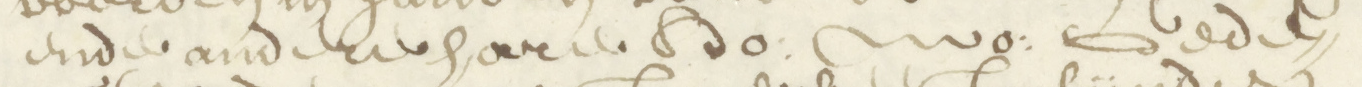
ende andere hare Ho:Mo: Gede,,
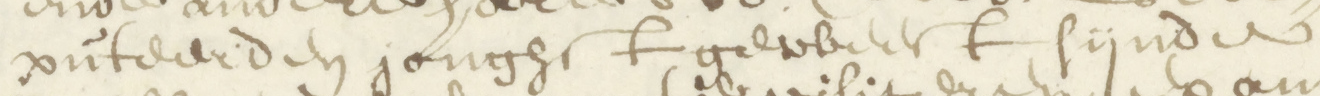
puteerden jonghst geweest sijnde
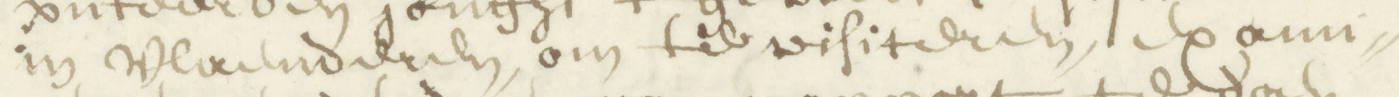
in Vlaenderen, om te visiteren, exami„,
